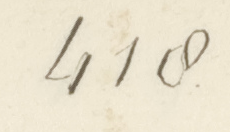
418
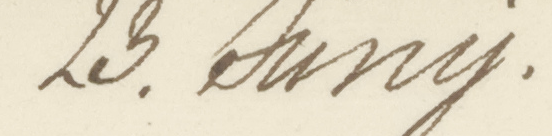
23. Junij.
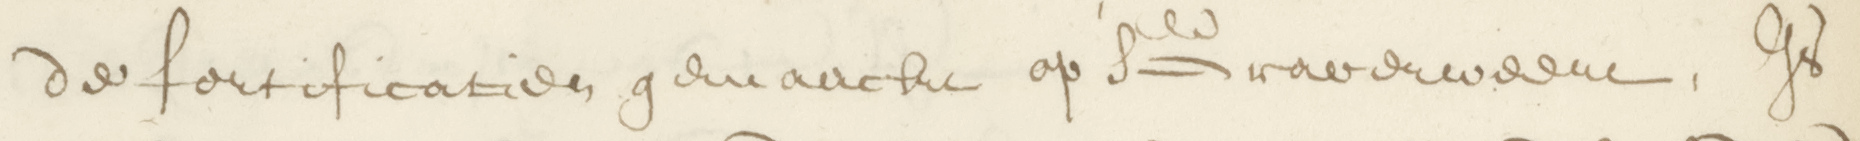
de fortificatien gemaackt op 's Gravenweert. Is
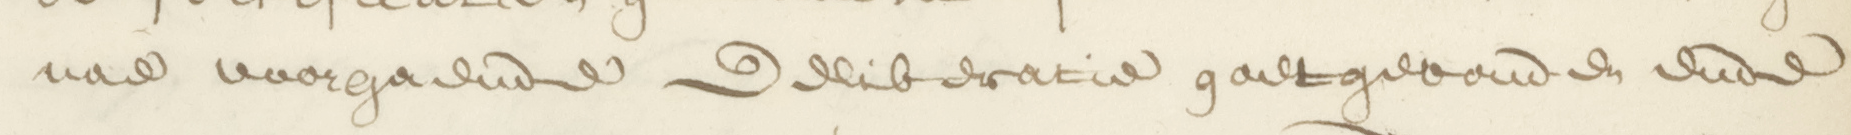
nae voorgaende Deliberatie goetgevonden ende
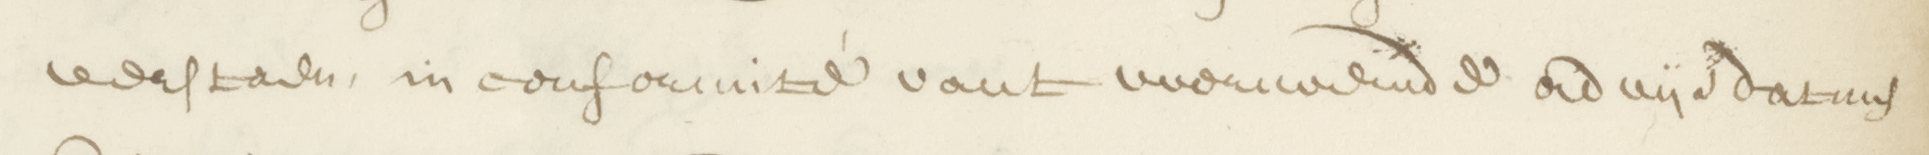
verstaen, in conformié vant voornoemde advijs datmen
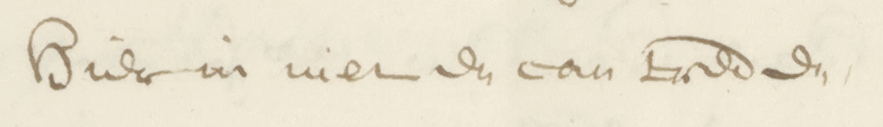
hierin niet en can treden.
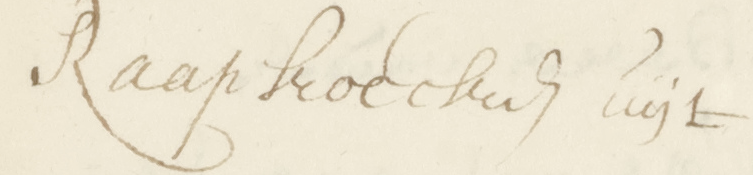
Raapkoecken uijt
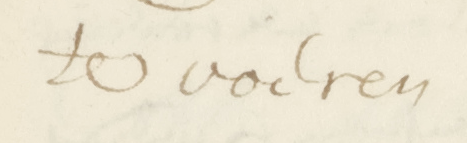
te voeren
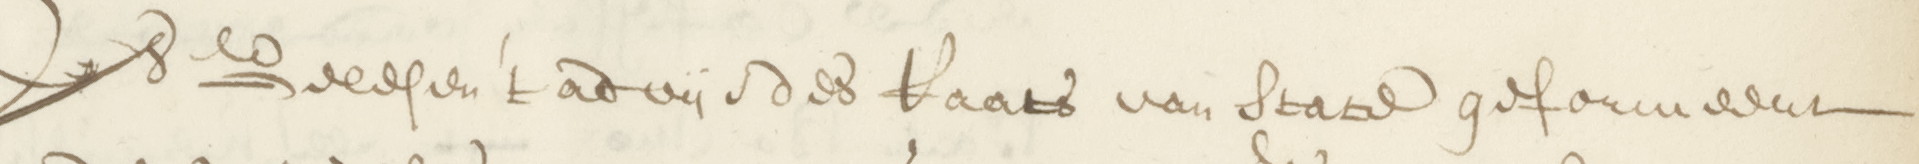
Is Gelesen 't advijs des Raats van State geformeert
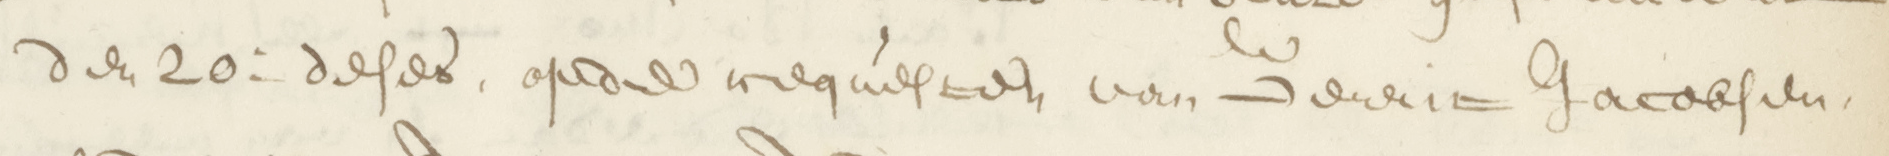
den 20: deses, opde requesten van Gerrit Jacobsen,
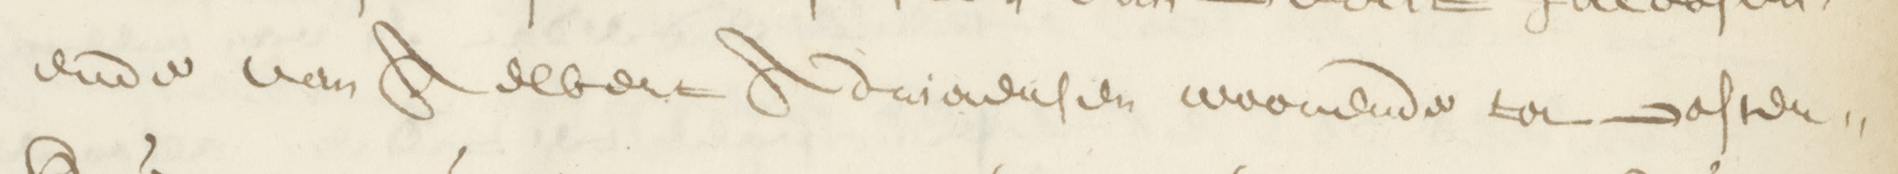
ende van Aelbert Adriaensen woonende in Ooster„
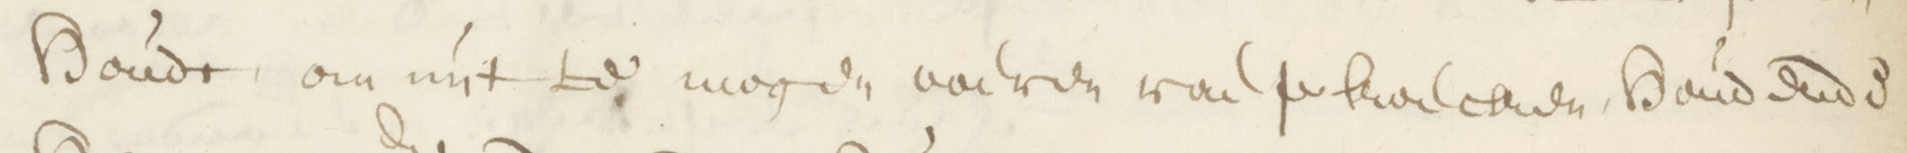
houdt, om uijt te mogen voeren raepkoecken, houdende
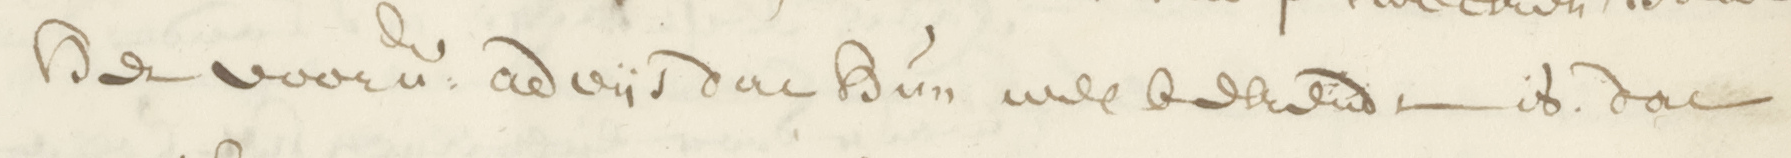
het voorn: advijs dat hun wel bekendt is dat
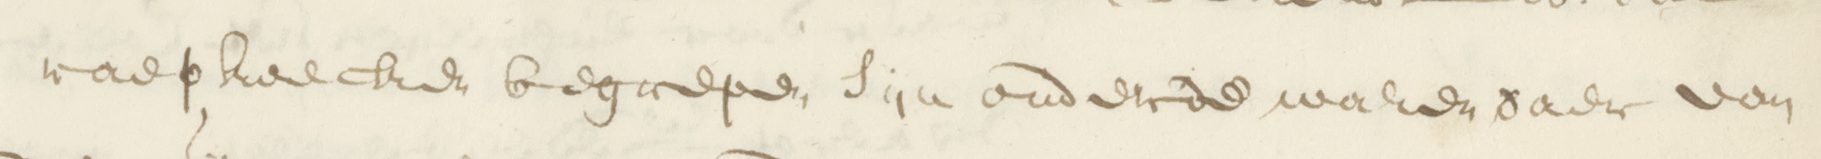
raepkoecken begrepen sijn onder de waren daer van
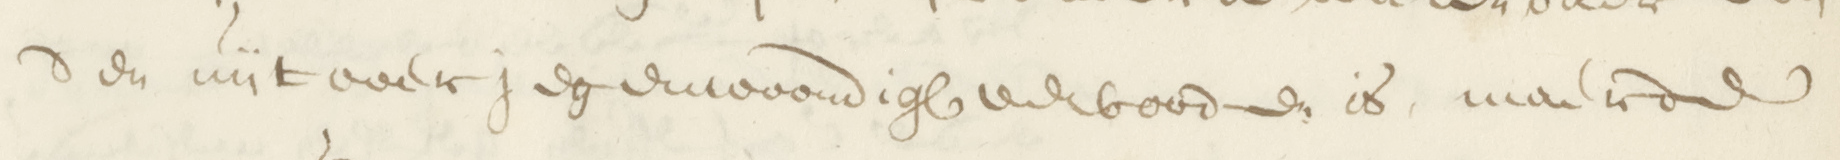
den uijtvoer jegenwoordigh verbooden is, maer de
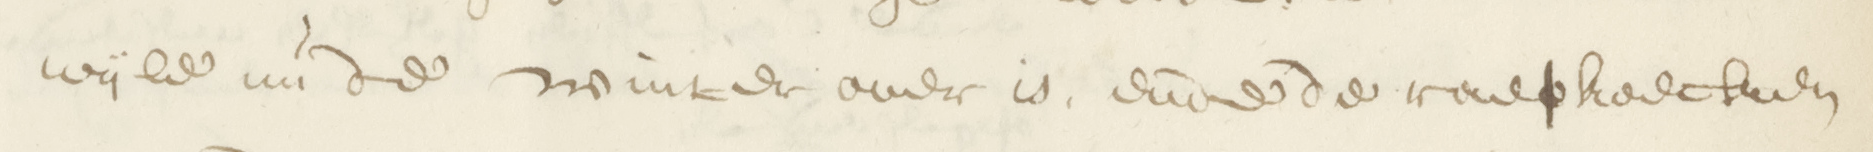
wijle nu de winter over is, ende de raepkoecken
